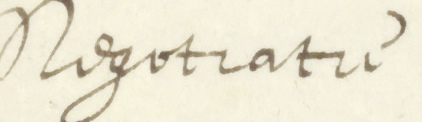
Negotiatie
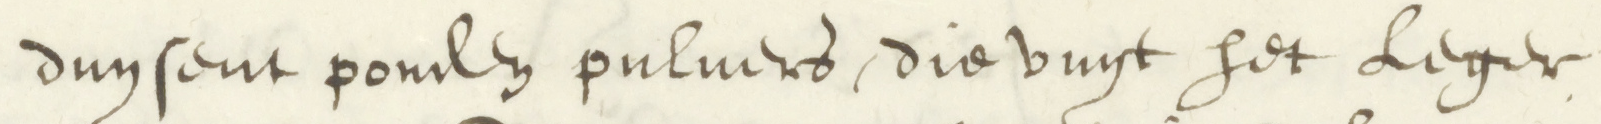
duysent ponden puluers, die vuyt het leger
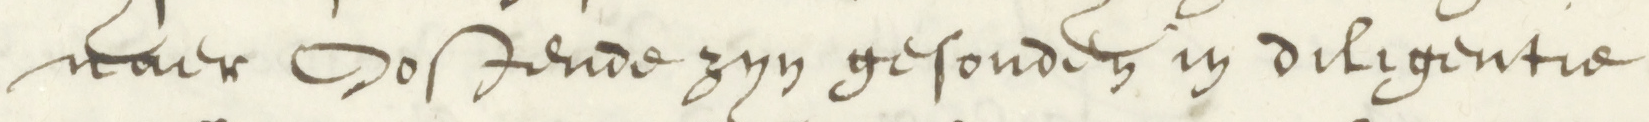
naer Oostende zyn gesonden in diligentie
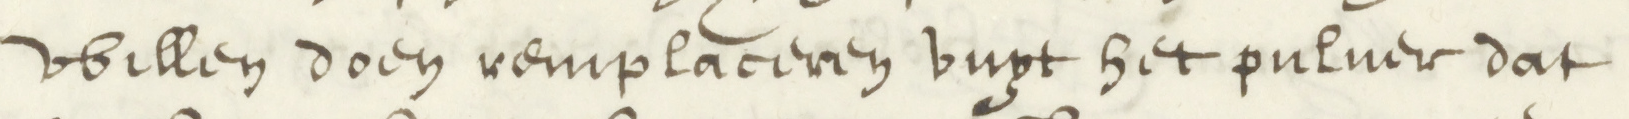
willlen doen remplaceren vuyt het puluer dat
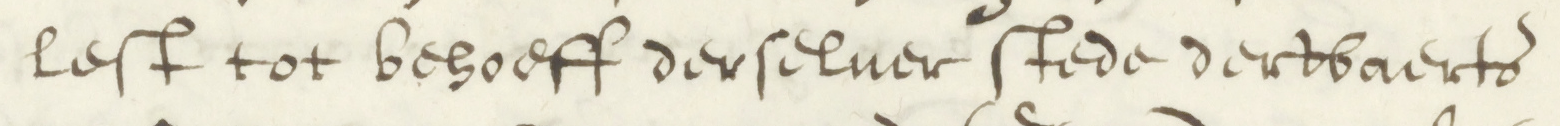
lest tot behoeff derseluer stede derwaerts
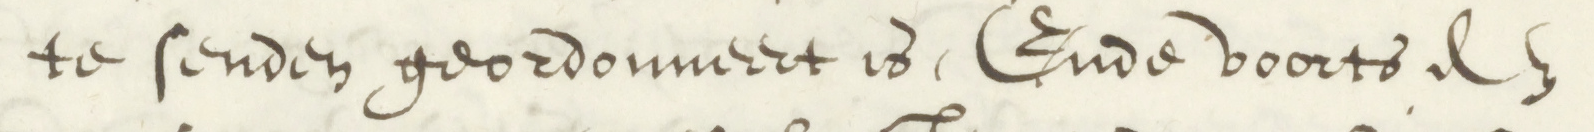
te senden geordonneert is. Ende voorts den
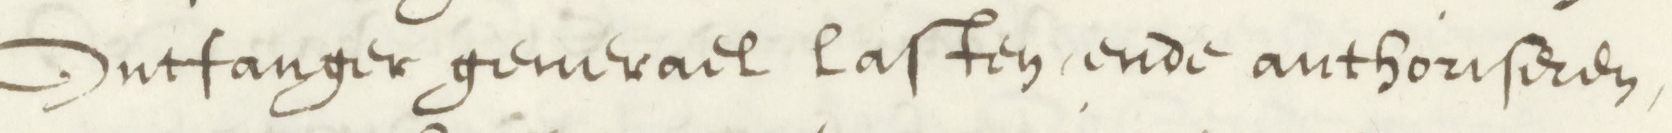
Ontfanger generael lasten, ende authoriseren
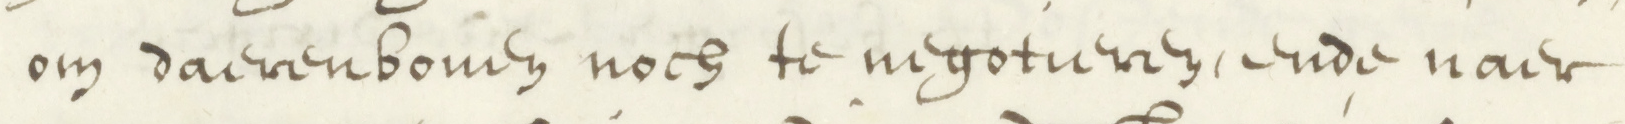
om daerenbouen noch te negotieren, ende naer
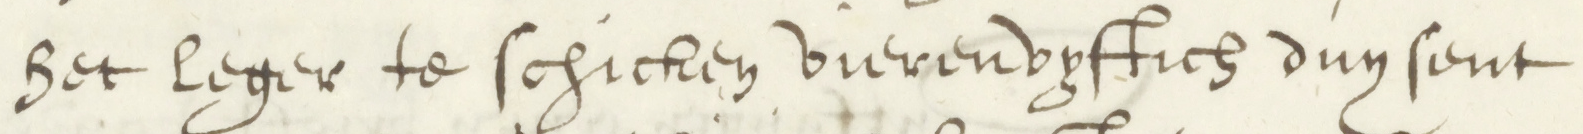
het leger te schicken vierenvyftich duysent
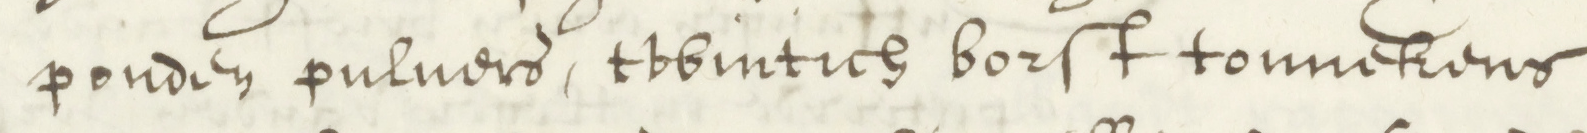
ponden puluers, twintich borst tonnekens,
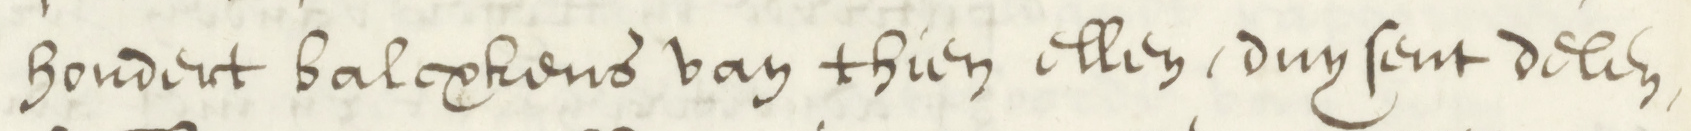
hondert balcxkens van thien ellen, duysent delen,
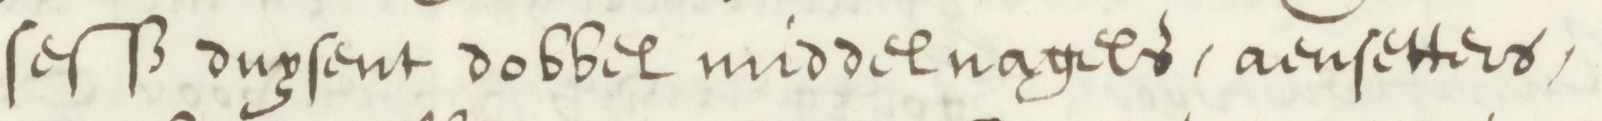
sess duysent dobbel middelnagels, aensetters,
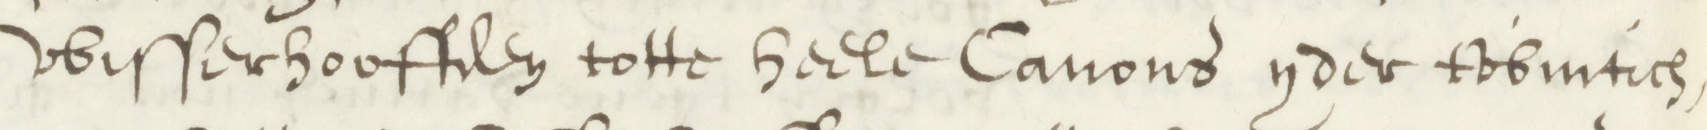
wisserhooffden totte heele Canons yder twintich,
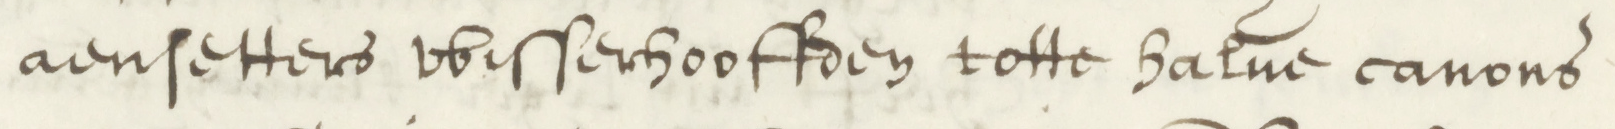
aensetters wisserhooffden totte halue canons
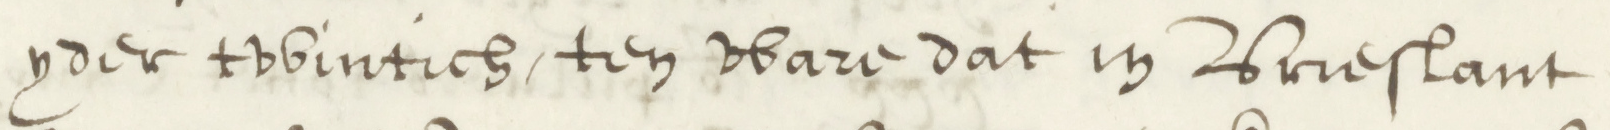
yder twintich, ten ware dat in Vrieslant
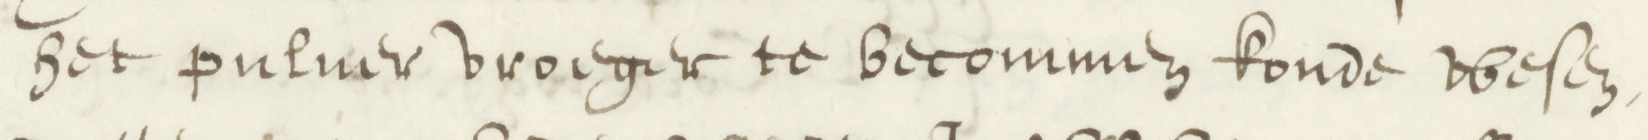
het puluer vroeger te becommen konde wesen,
